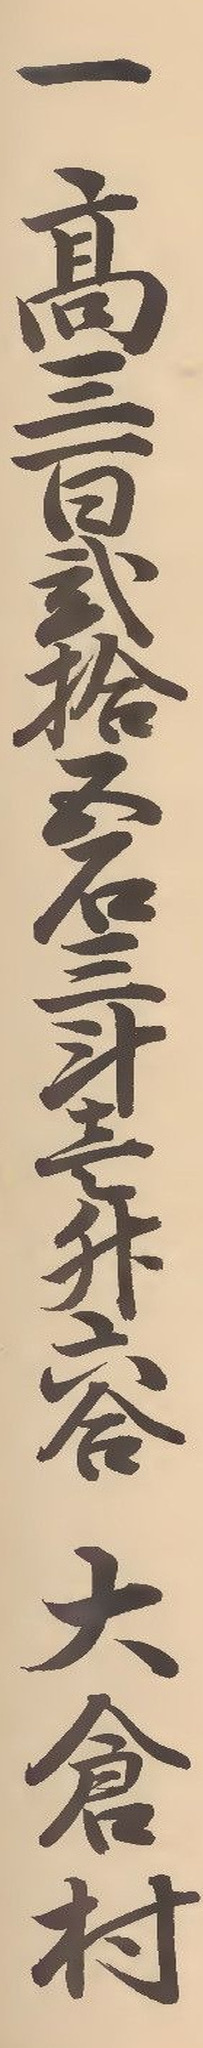一高三百弐拾五石三斗壱升六合大倉村
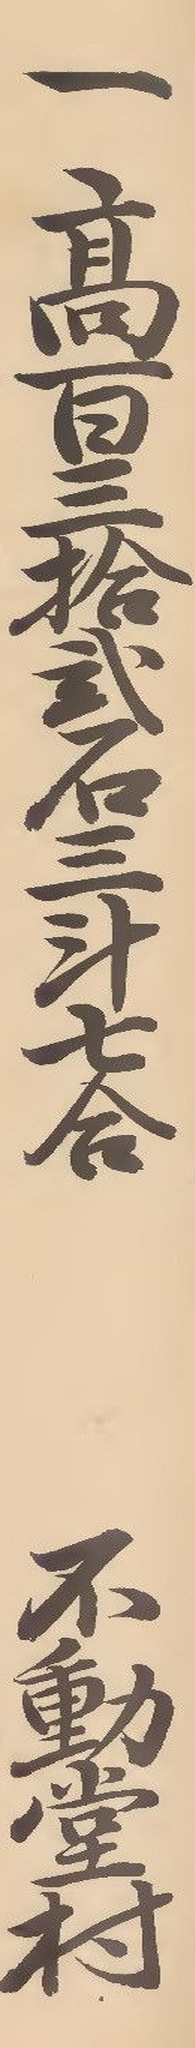一高百三拾弐石三斗七合不動堂村
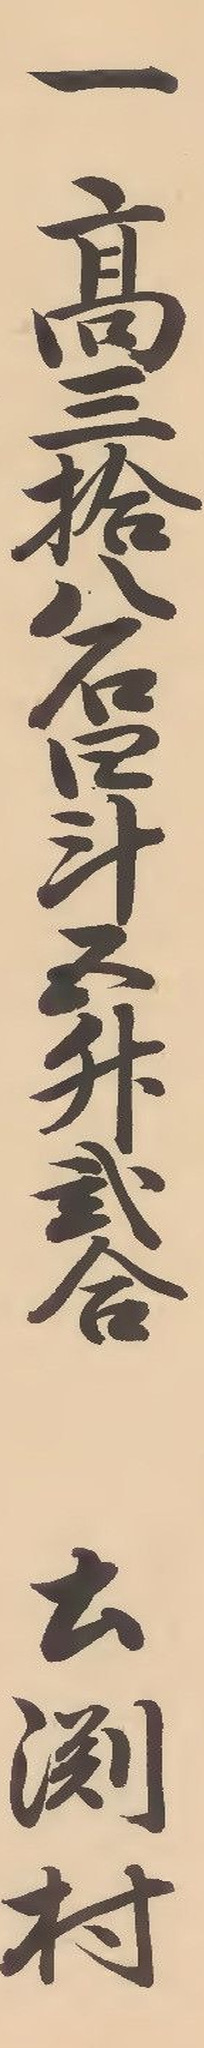一高三拾八石四斗五升弐合土淵村
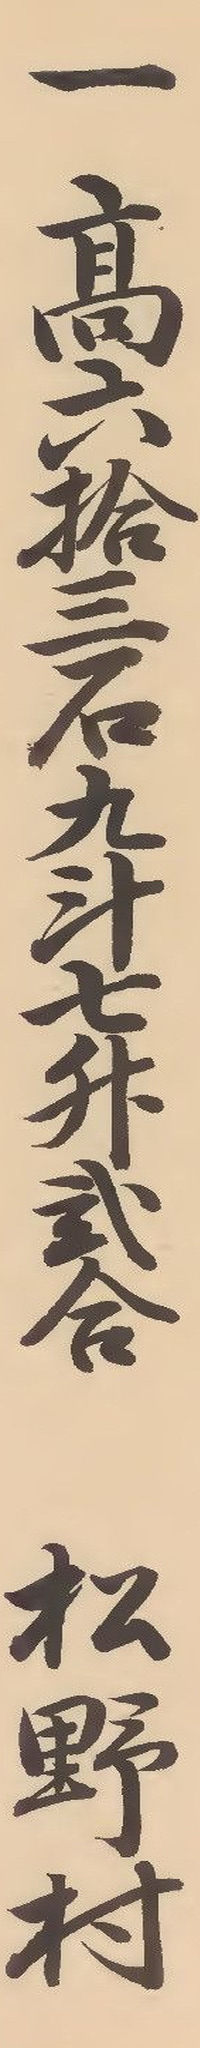一高六拾三石九斗七升弐合松野村
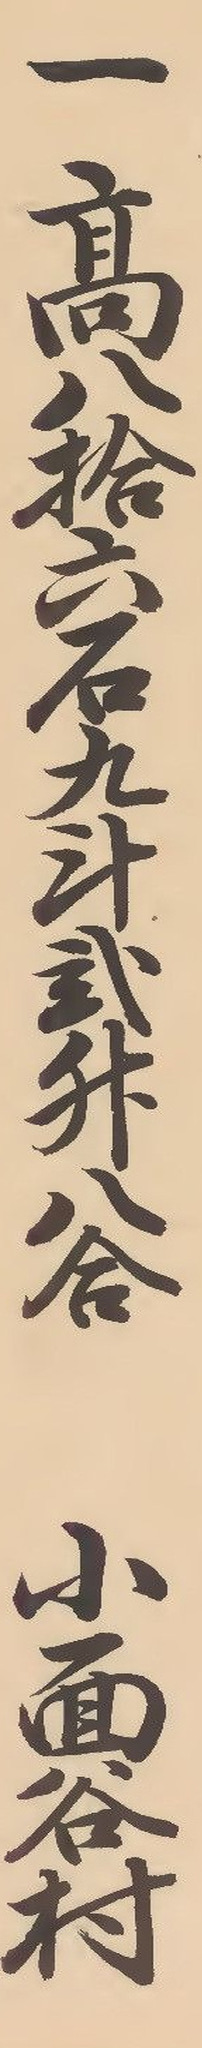一高八拾六石九斗弐升八合小面谷村

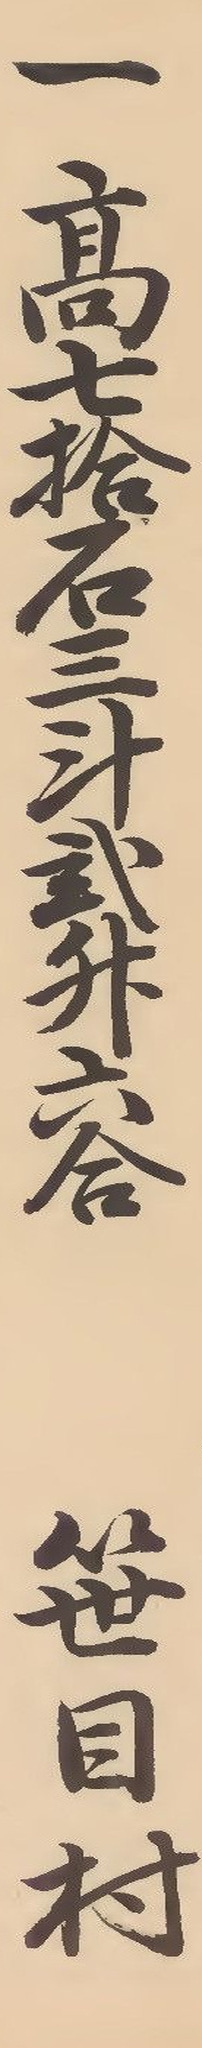一高七拾石三斗弐升六合笹目村
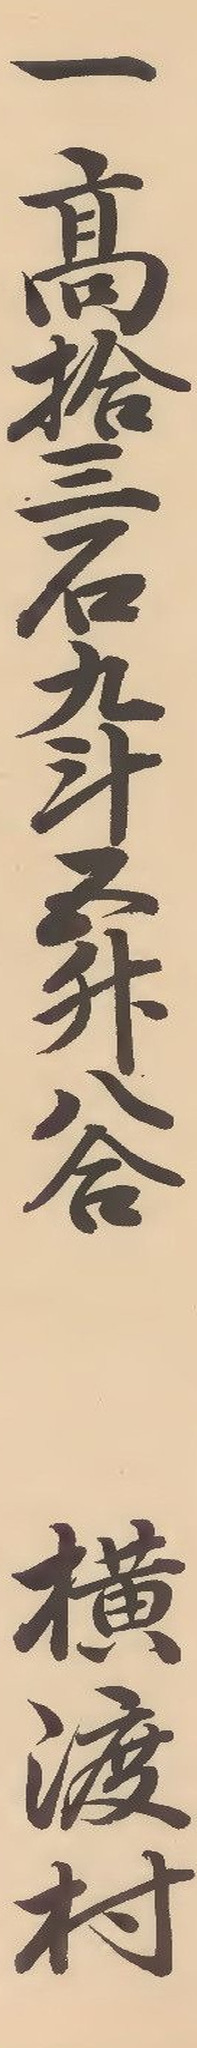一高拾三石九斗五升八合横渡村
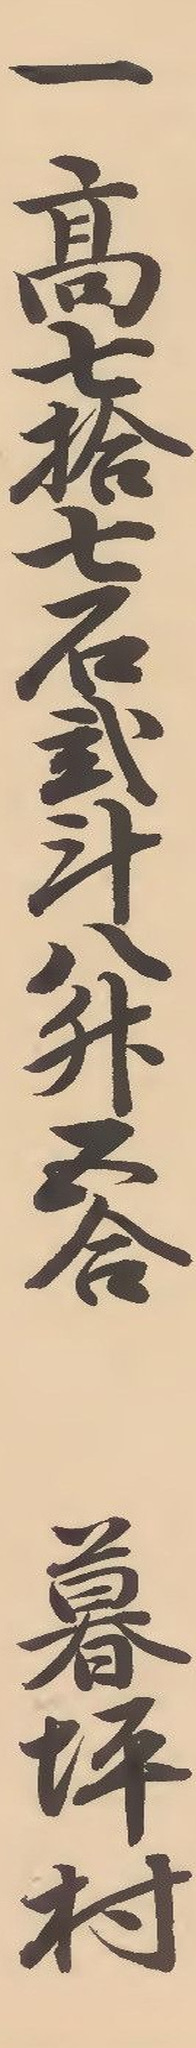一高七拾七石弐斗八升五合暮坪村
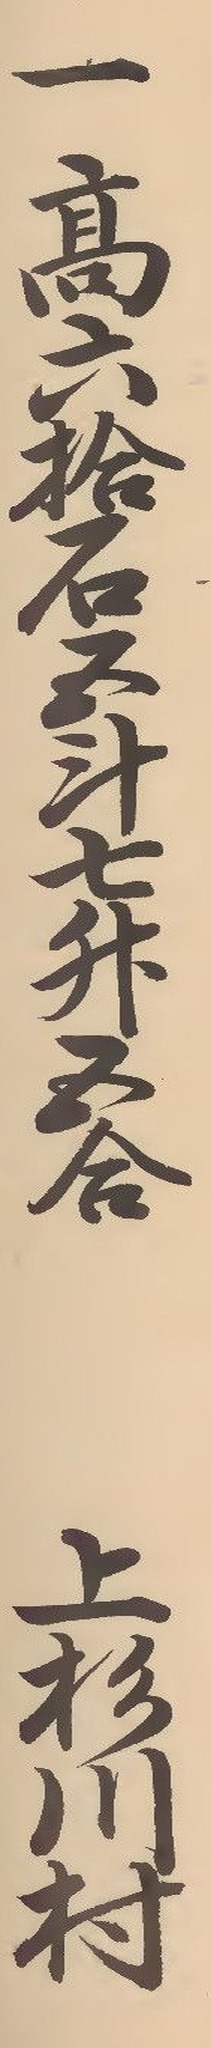一高六拾石五斗七升五合上杉川村
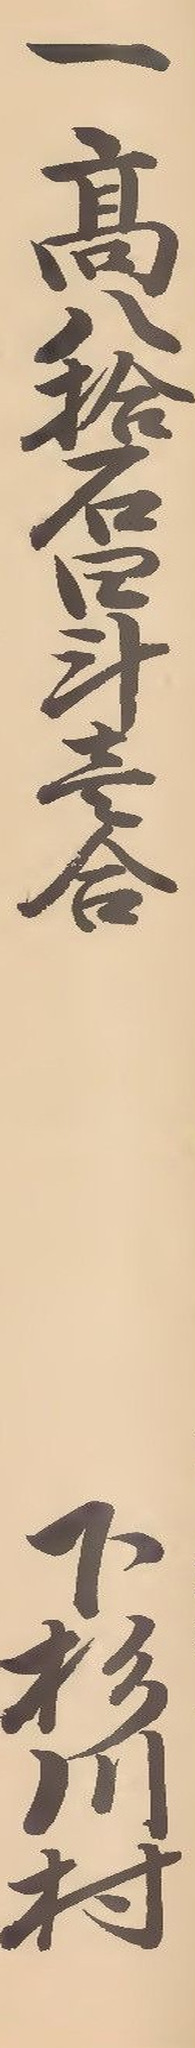一高八拾石四斗壱合下杉川村
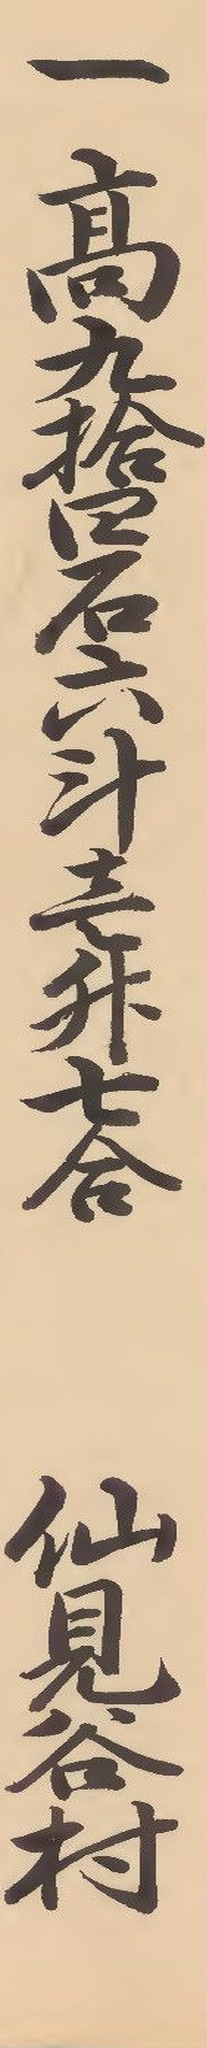一高九拾四石六斗壱升七合仙見谷村
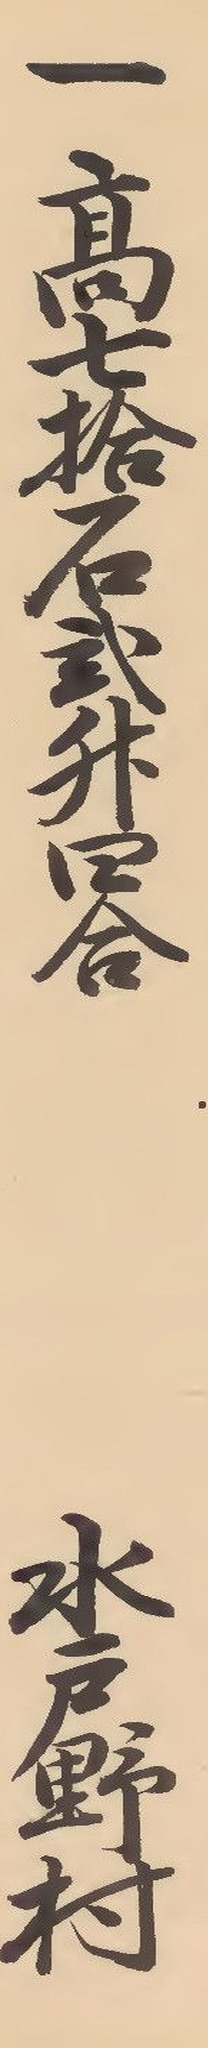一高七拾石弐升四合水戸野村
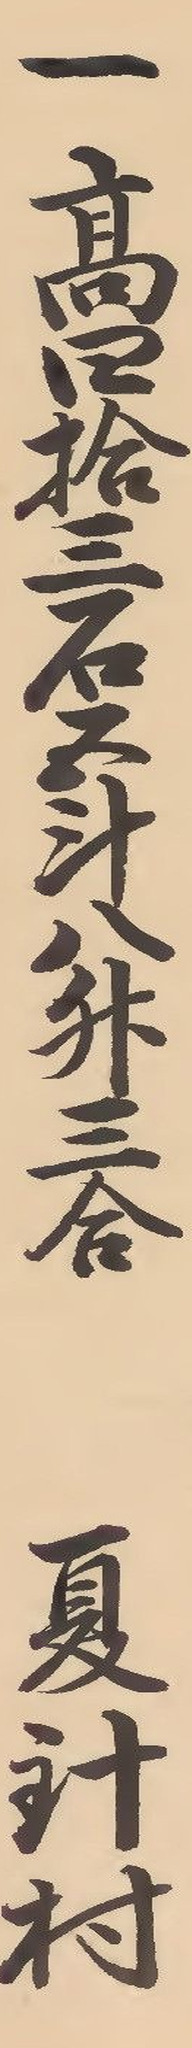一高四拾三石五斗八升三合夏針村

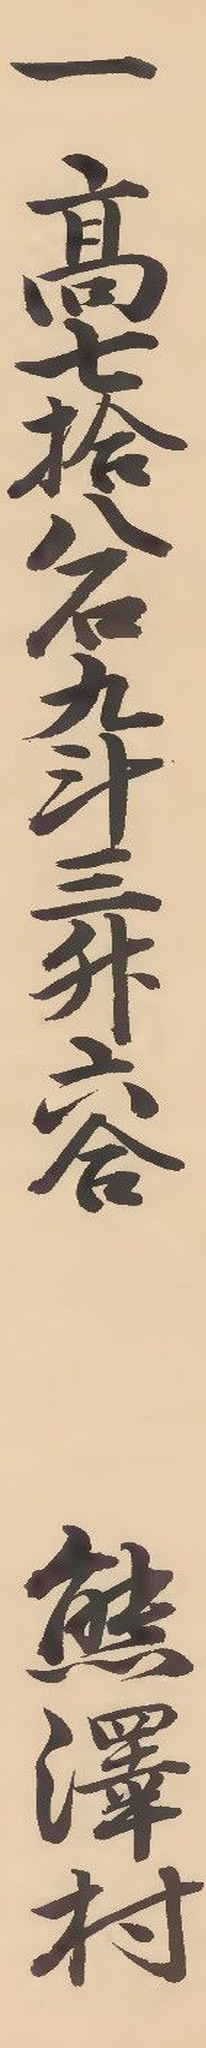一高七拾八石九斗三升六合熊沢村
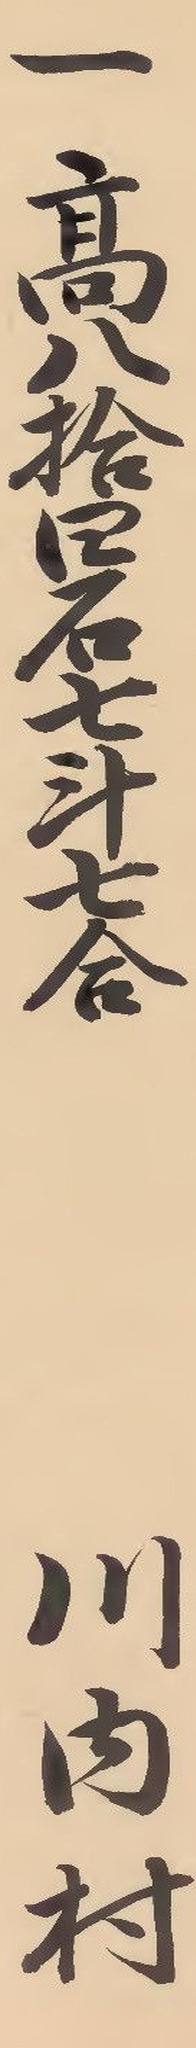一高八拾四石七斗七合川内村
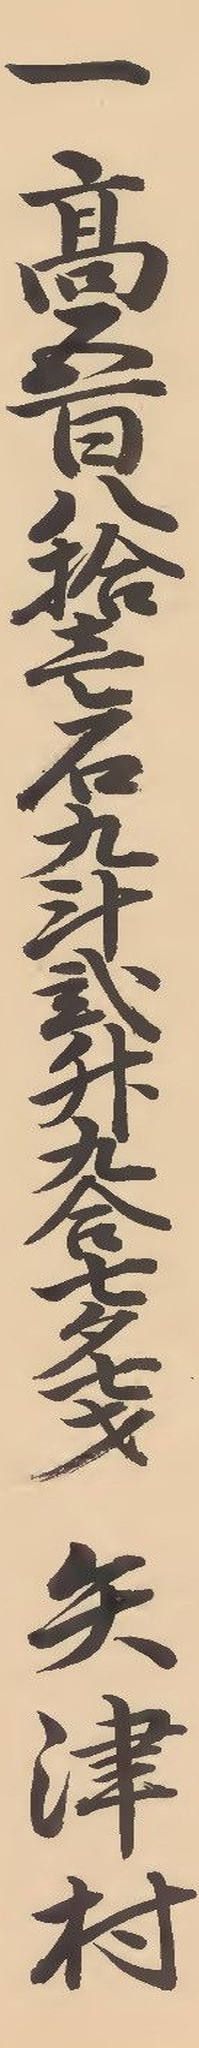一高五百八拾壱石九斗弐升九合七勺七才矢津村
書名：越後国郷帳　下
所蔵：国立公文書館 National Archives of Japan
